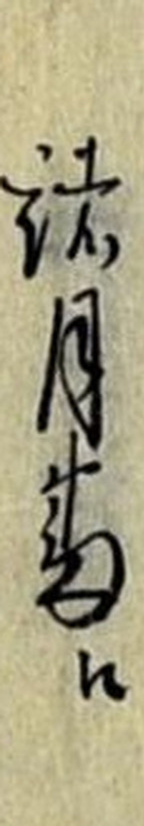諸月番江
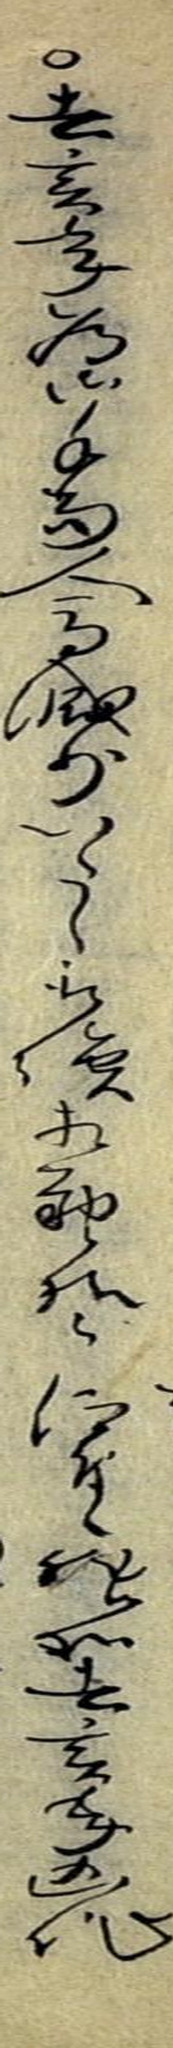〇去亥年為御手当人高減少いたし取続相勤候様被仰付候然ル処去亥年凶作
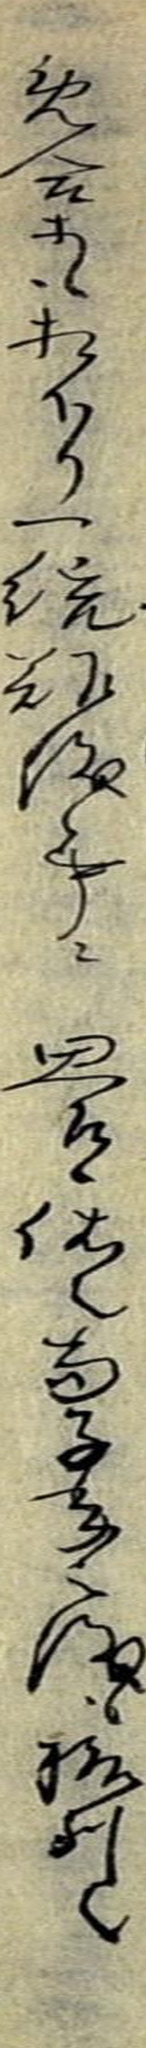免合等も相下り一統難儀候事ニ思召候依之当子年之儀も格別之
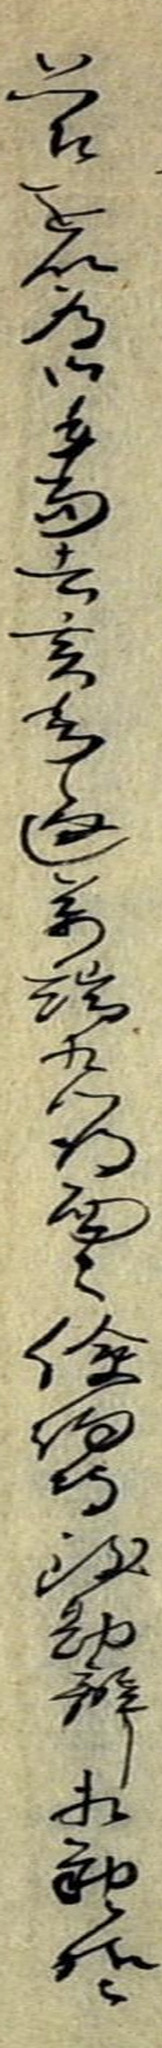思召を以為御手当去亥年之通万端相心得面々倹約専致勘弁相勤候様被
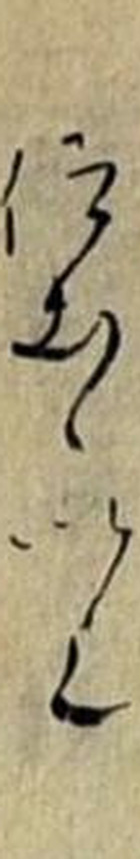仰出候以上
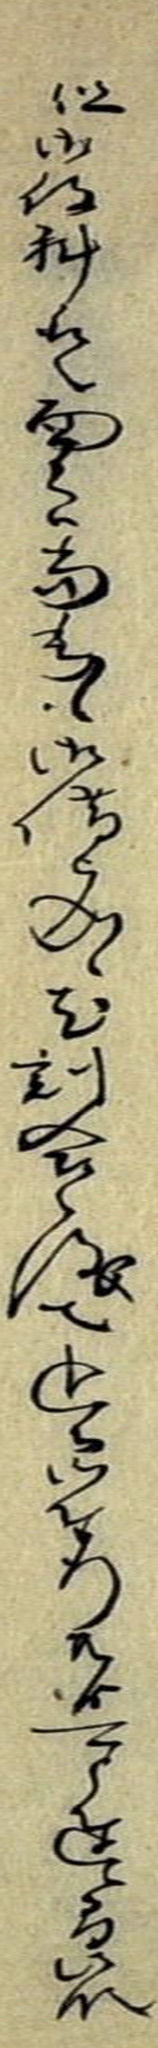但御役料取之面々ハ当年も御借被成候尤割合之儀者追而御奉行共ゟ可申達候間此段
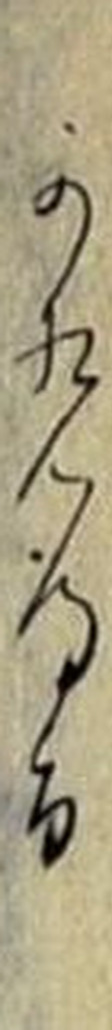可相心得旨
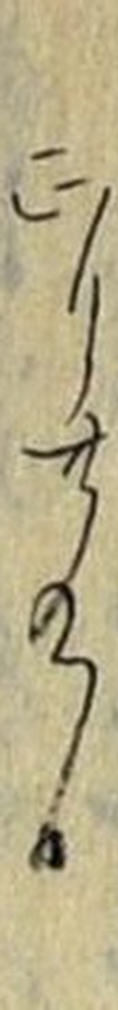正月廿九日
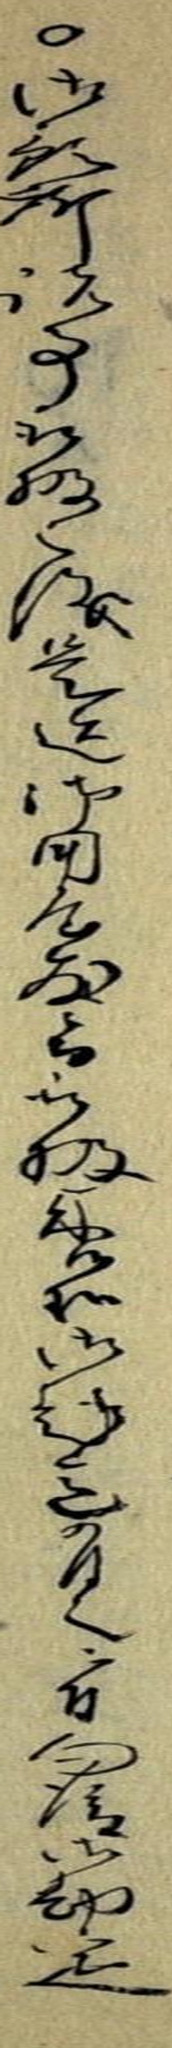〇御預所諸事取扱之儀是迄御用屋敷ニ而取扱来候処御趣意有之ニ付向後御勘定
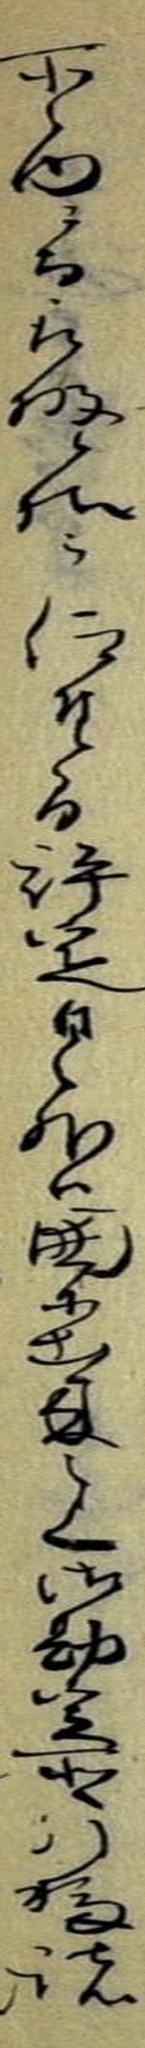所之内ニ而取扱候様被仰付候間評定日之外ハ囲等出来之上御勘定所へ引移諸
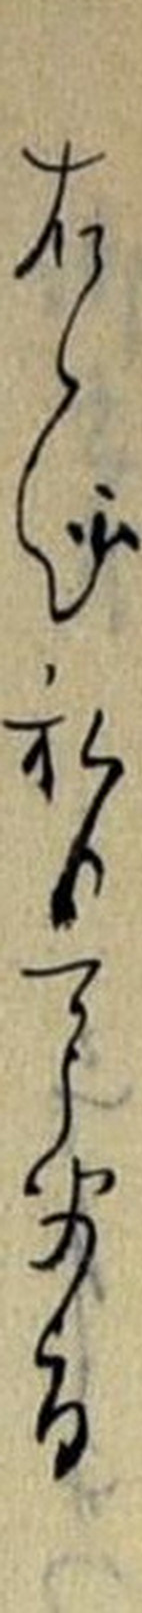右之趣私ゟ可申聞旨
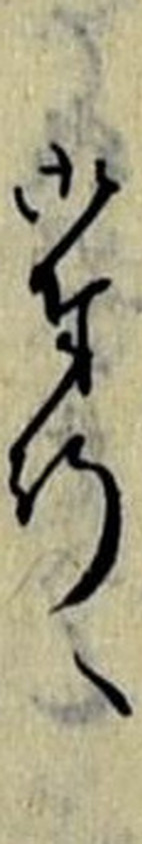御奉行へ
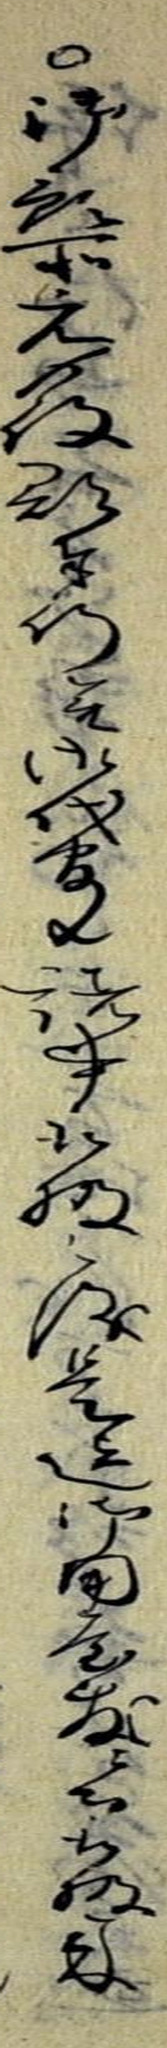〇御預所元〆役郡奉行并御代官共諸事取扱之儀是迄御用屋敷ニ而取扱来
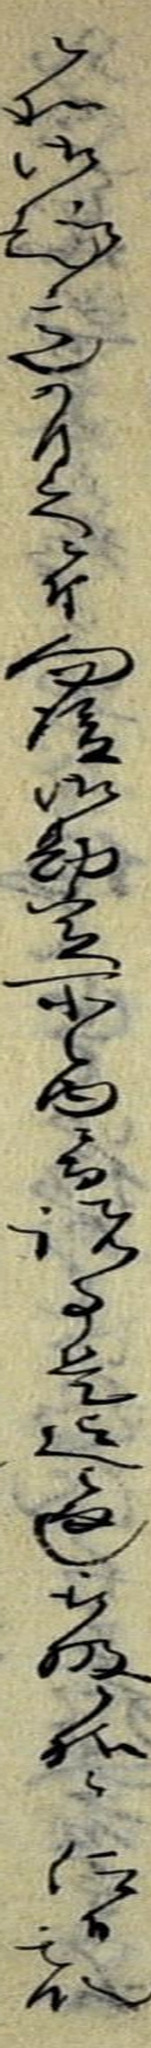候処御趣意有之ニ付向後御勘定所之内ニ而諸事是迄之通取扱候様被仰付其段
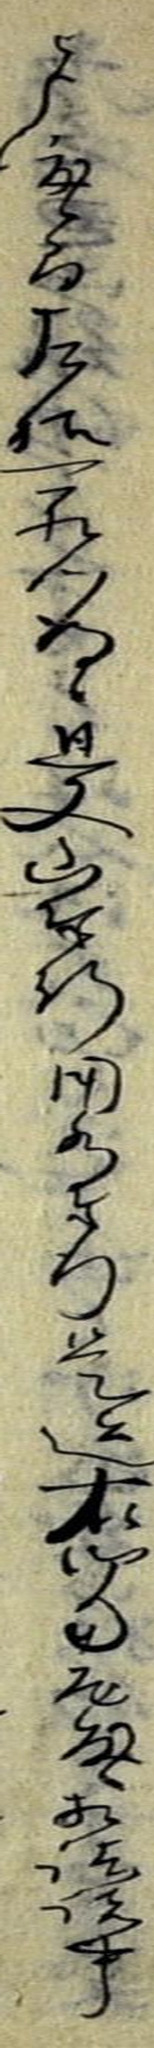被申渡候間左様可相心得候且又山奉行用水奉行是迄右御用屋敷へ相詰諸事
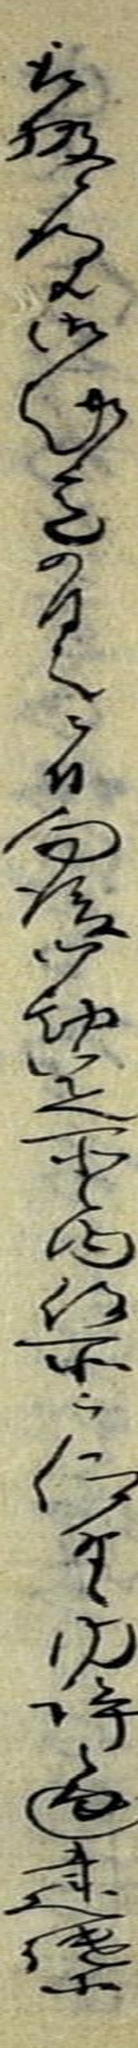取扱候得共御趣意有之ニ付向後御勘定所之内役所被仰付候内評之通建継等
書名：命令之部 三
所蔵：福井県文書館 Fukui Prefectural Archives
